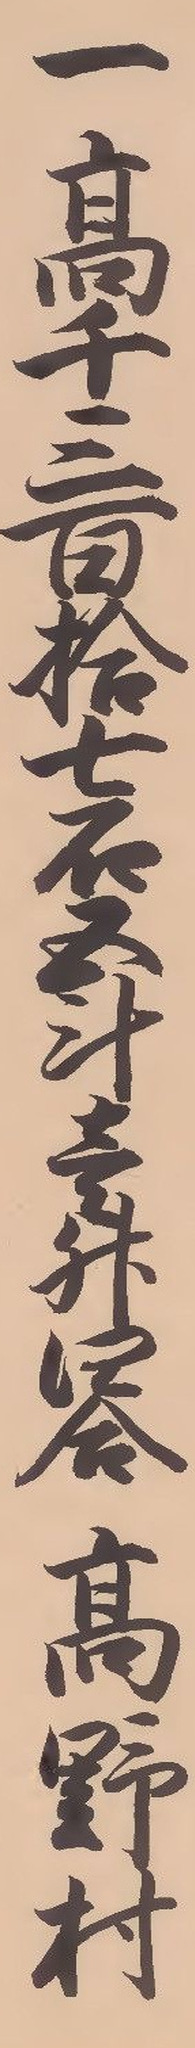一高千三百拾七石五斗壱升四合高野村
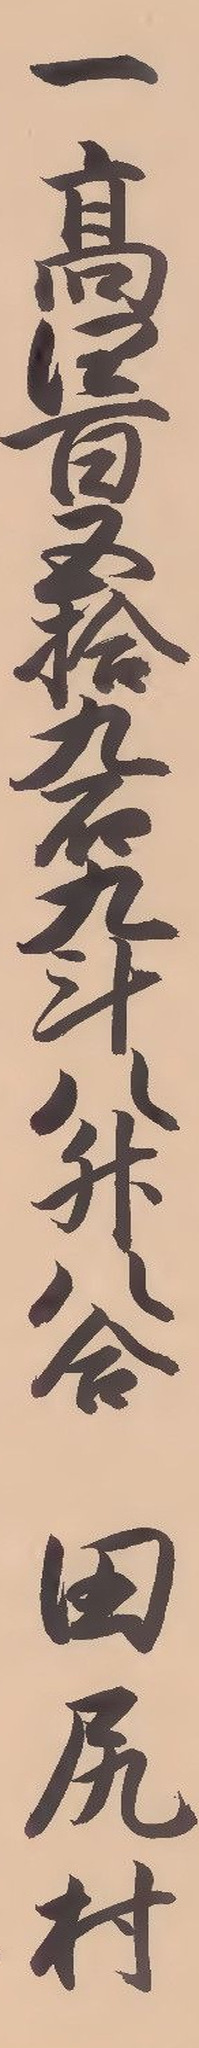一高四百五拾九石九斗八升八合田尻村
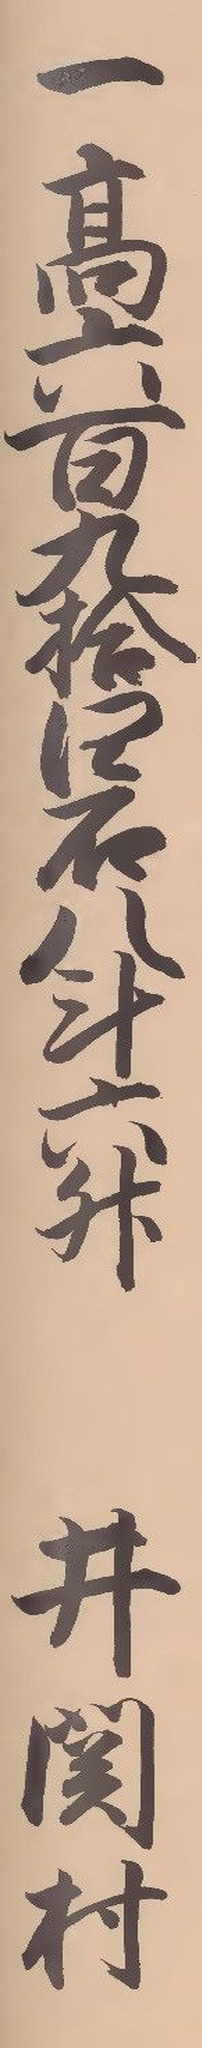一高六百九拾四石八斗六升井関村
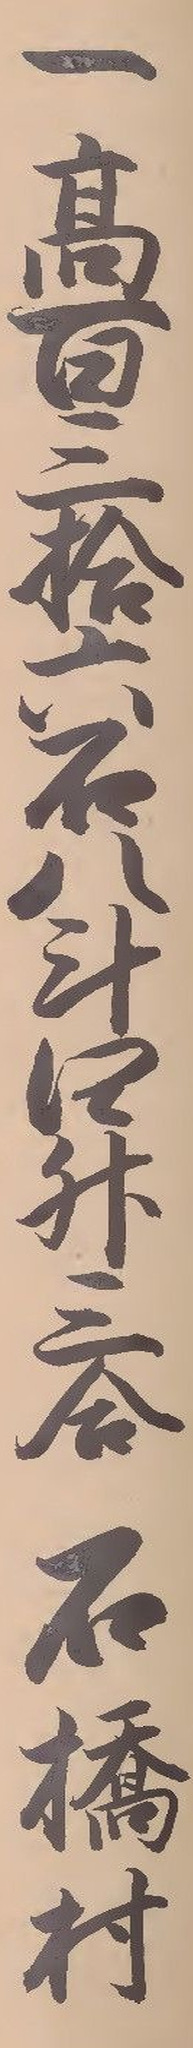一高百三拾六石八斗四升三合石橋村
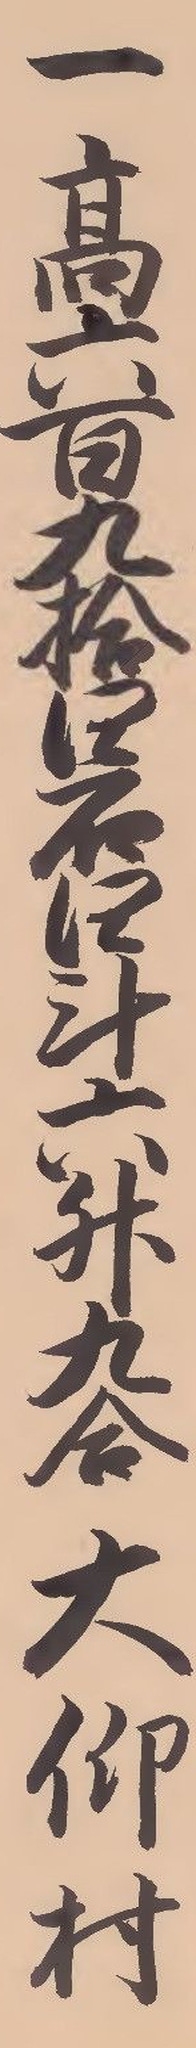一高六百九拾四石四斗六升九合大仰村
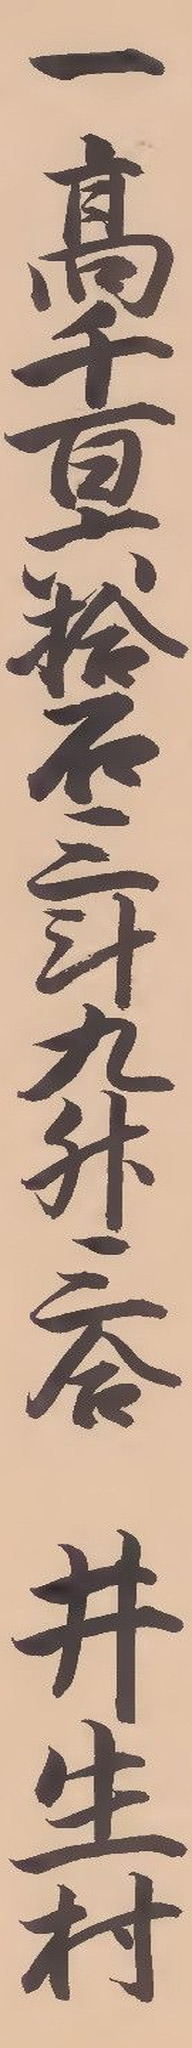一高千百六拾石三斗九升三合井生村
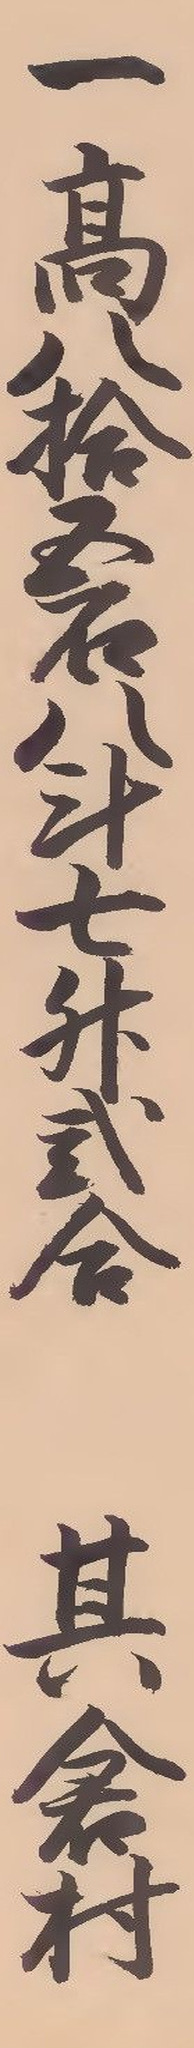一高八拾五石八斗七升弐合其倉村

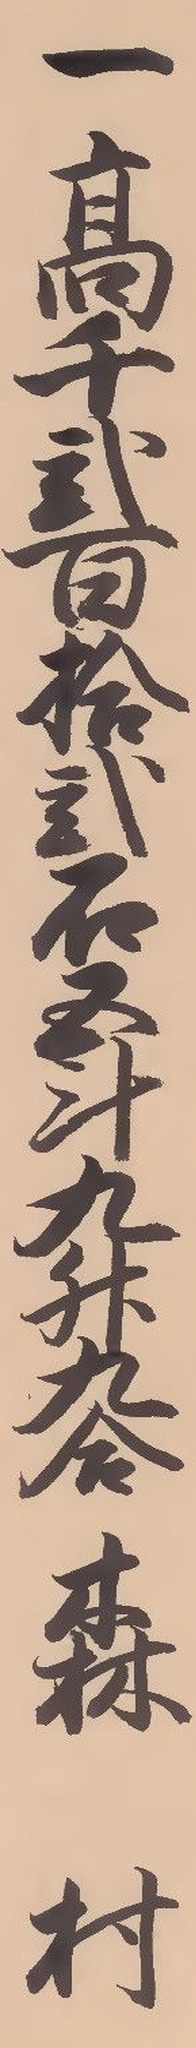一高千弐百拾弐石五斗九升九合森村
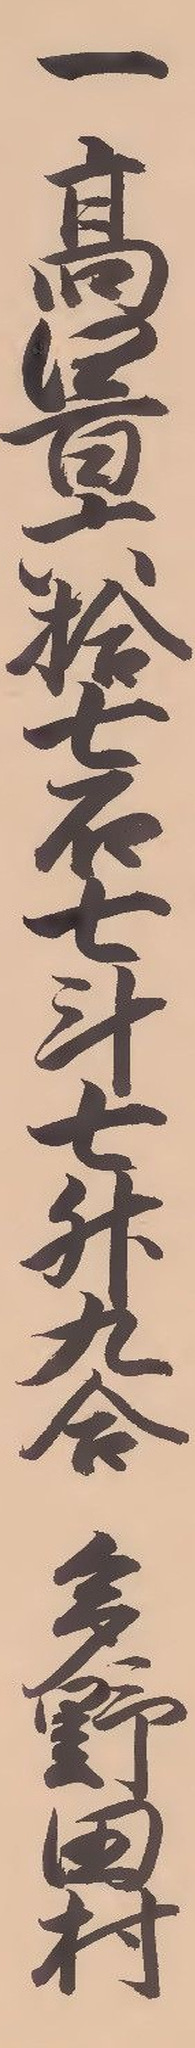一高四百六拾七石七斗七升九合多野田村
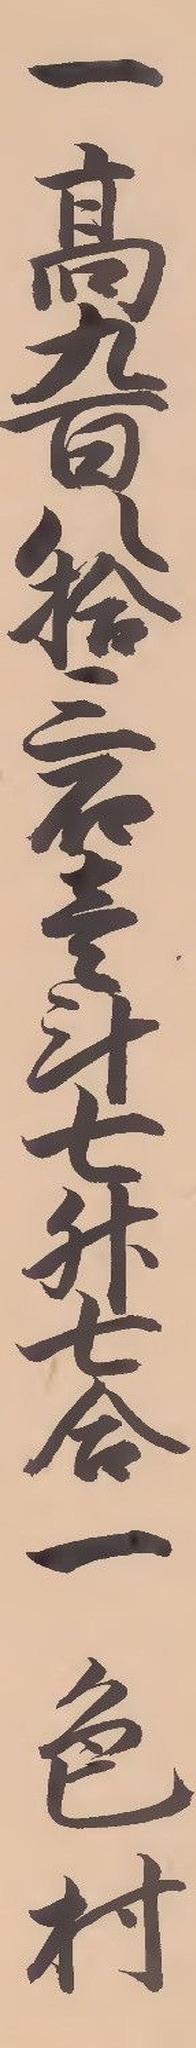一高九百八拾三石壱斗七升七合一色村
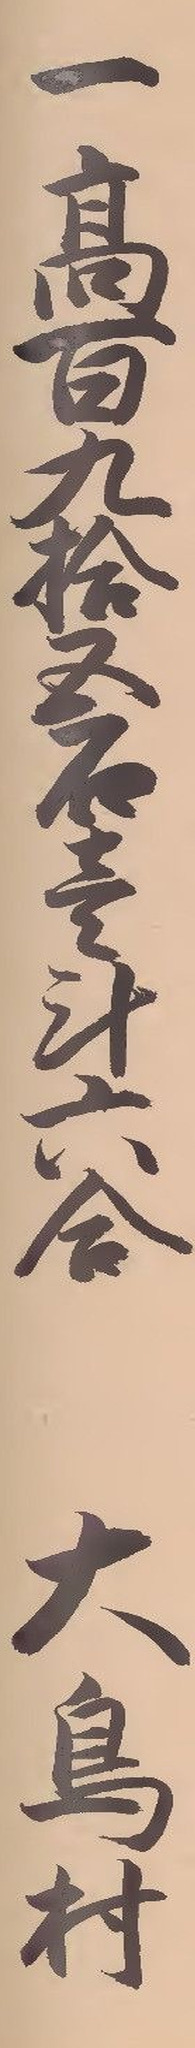一高百九拾五石壱斗六合大鳥村
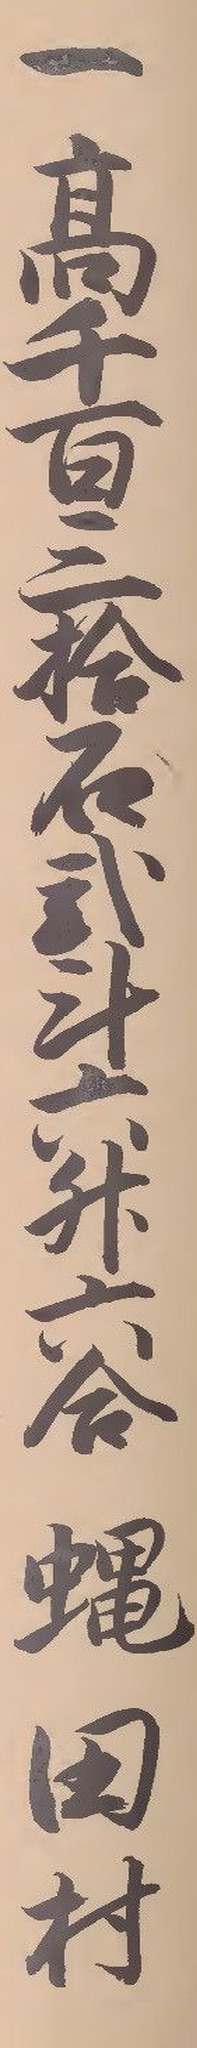一高千百三拾石弐斗六升六合蝿田村
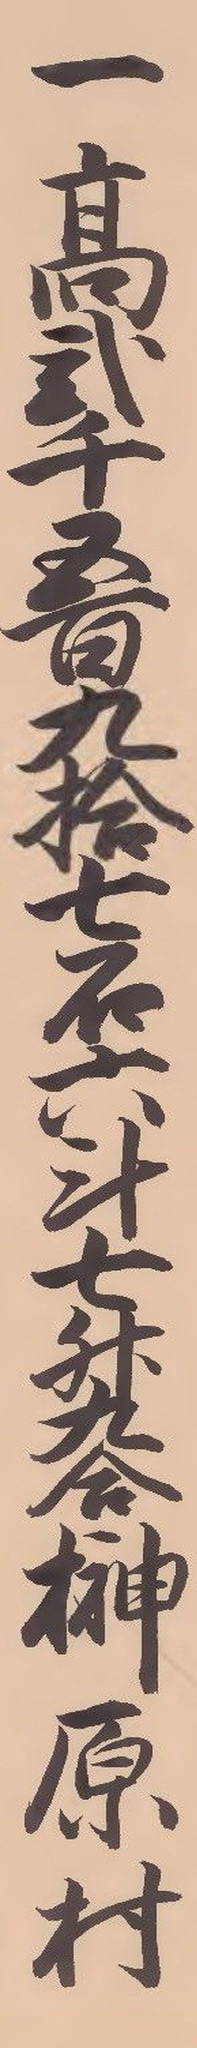一高弐千五百九拾七石六斗七升九合榊原村
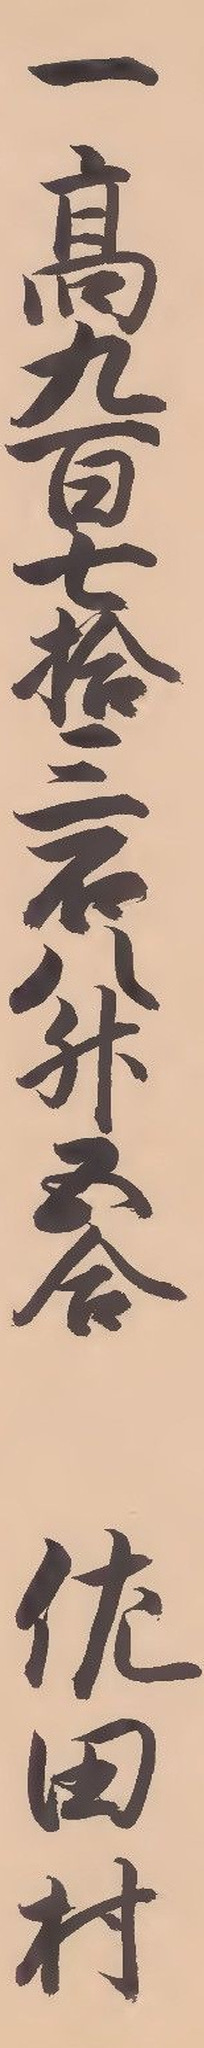一高九百七拾三石八升五合佐田村
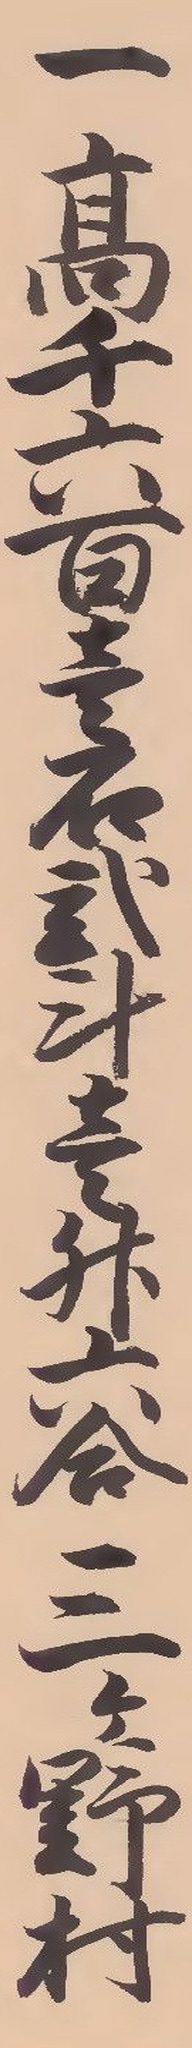一高千六百壱石弐斗壱升六合三ヶ野村

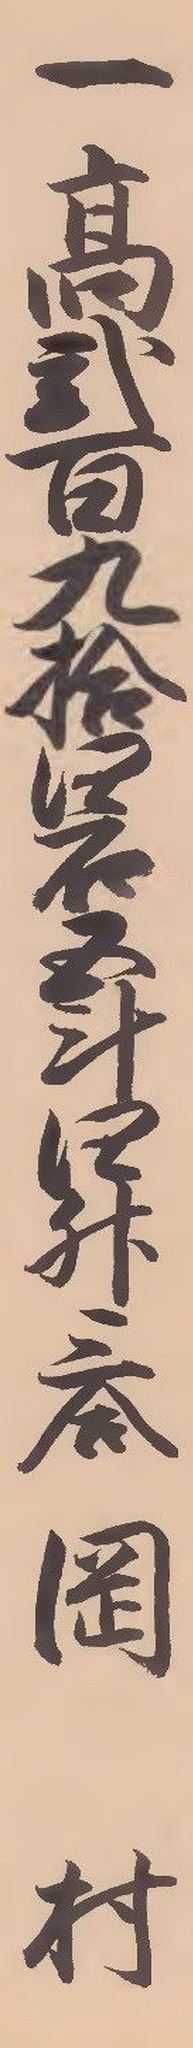一高弐百九拾四石五斗四升三合岡村
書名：伊勢国郷帳
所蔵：国立公文書館 National Archives of Japan
